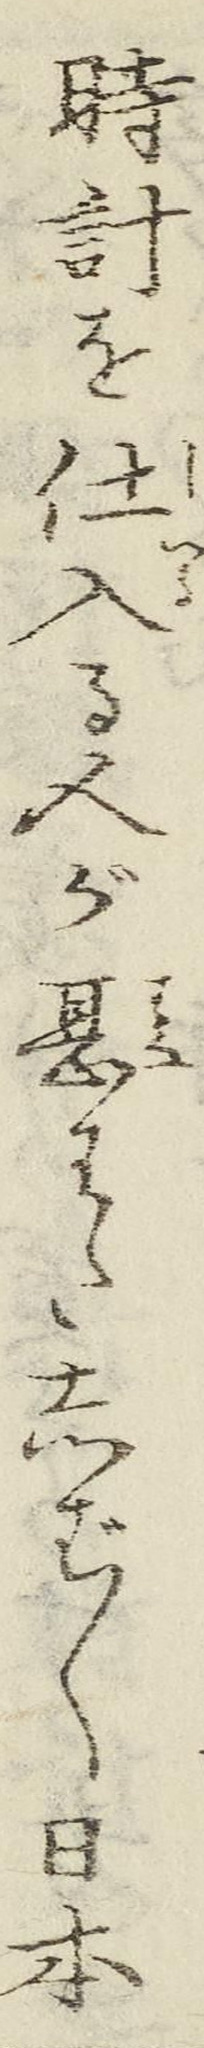時計を仕入る人が甚はたしば〳〵日本
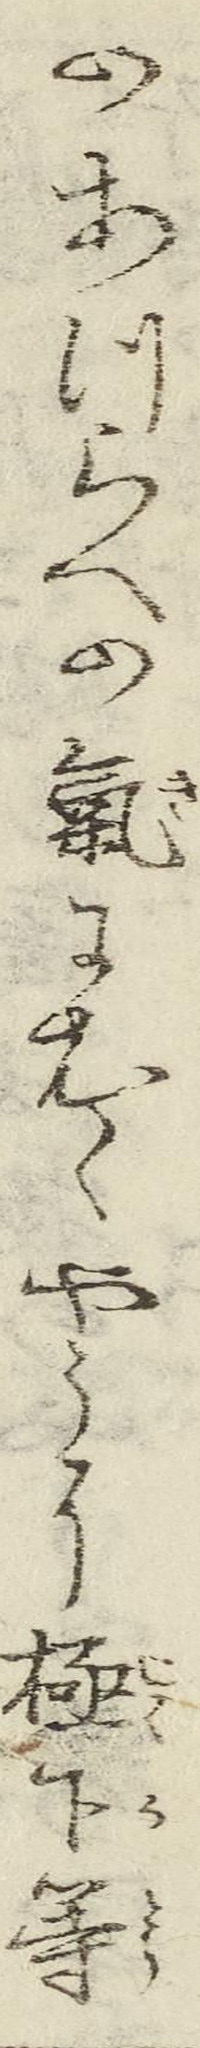のあつらへの気にむくやうに極下等
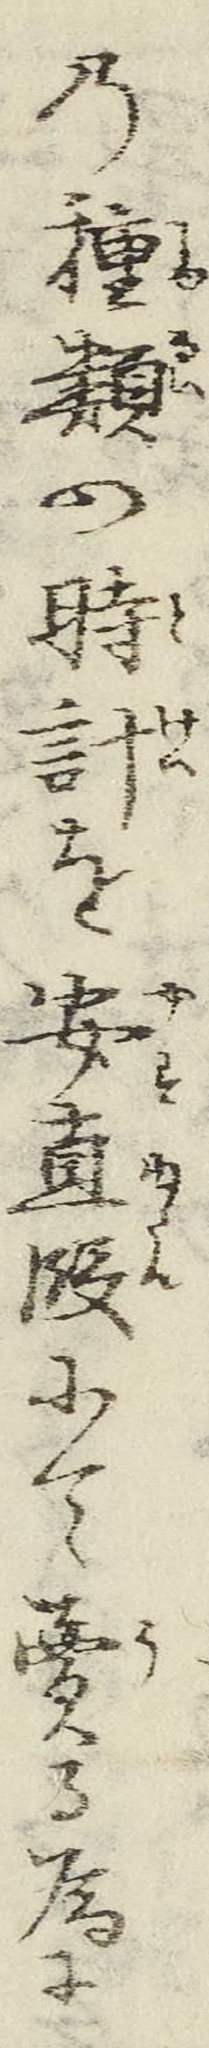の種類の時計を安直段にて売る為に
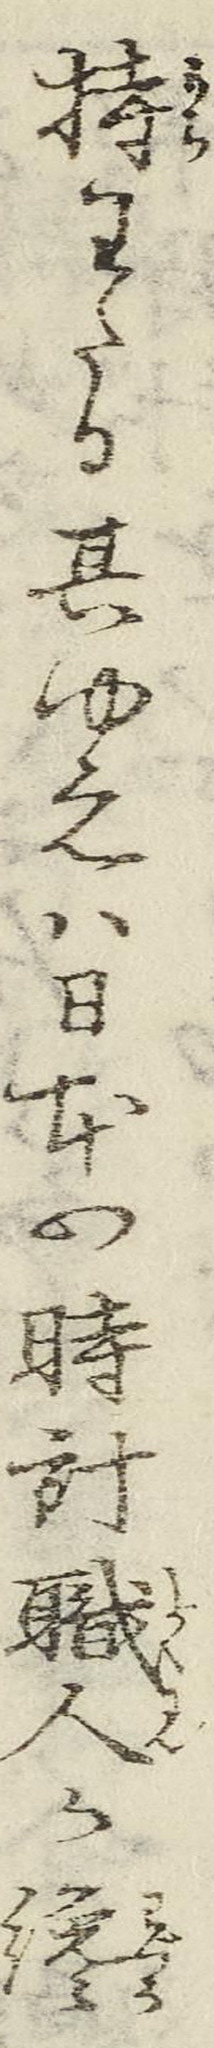持わたる其ゆえは日本の時計職人か纔
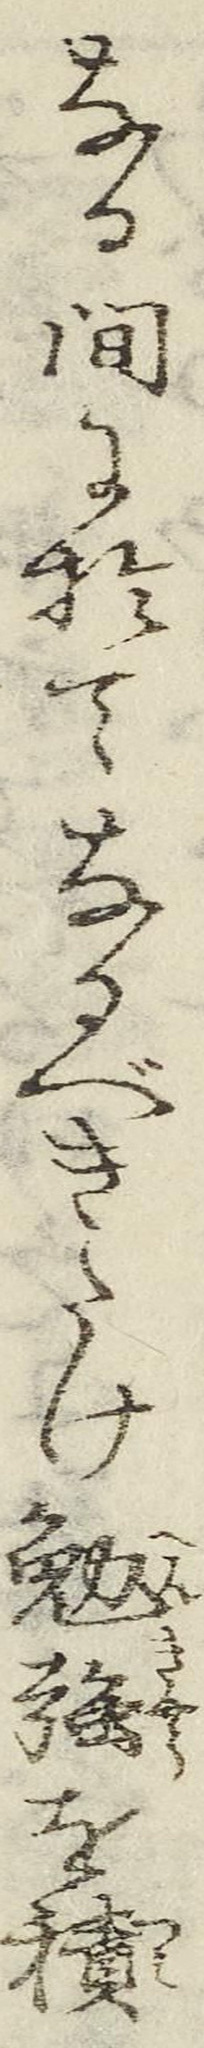なる間に於てなるべきたけ勉強を積
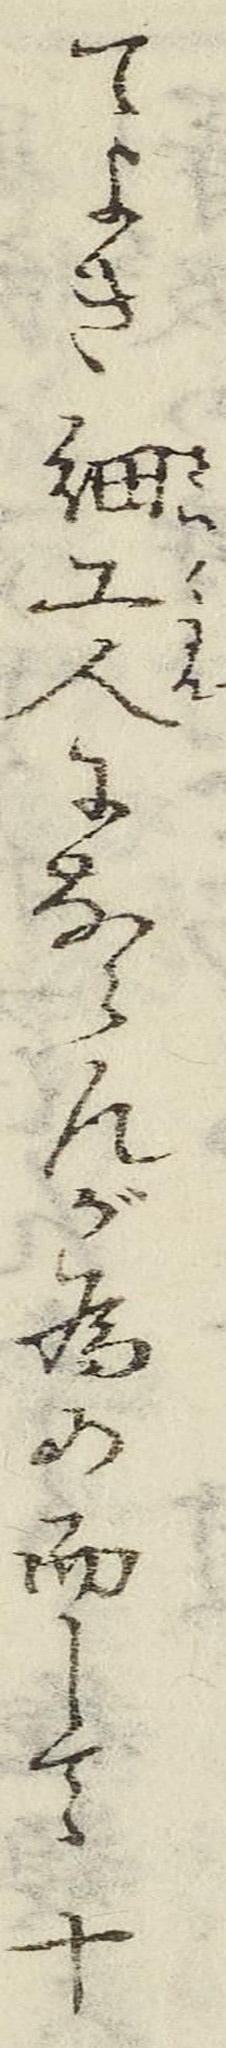てよき細工人にならんが為め而して十
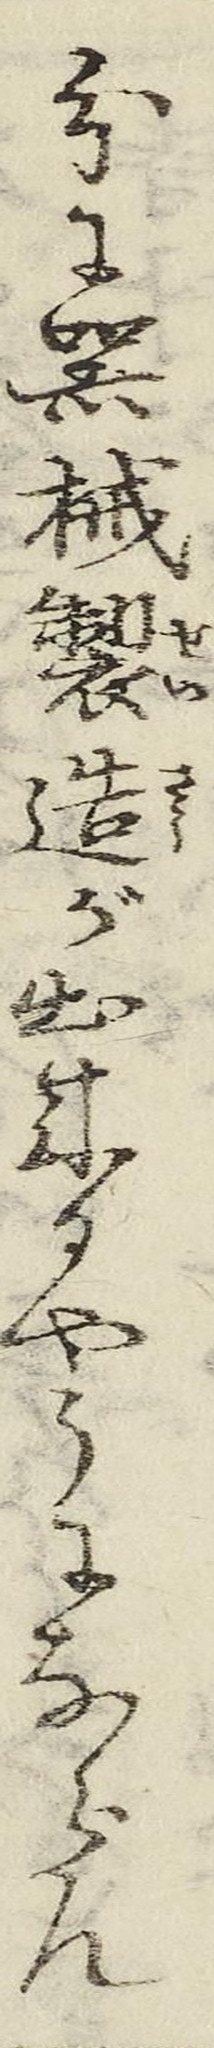分に器械製造が出来るやうにならん
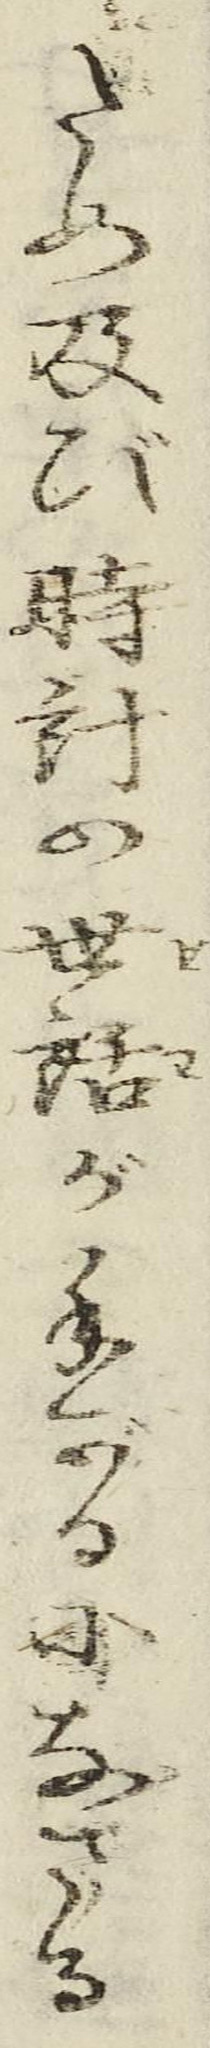ため及び時計の世話が手がるになさる
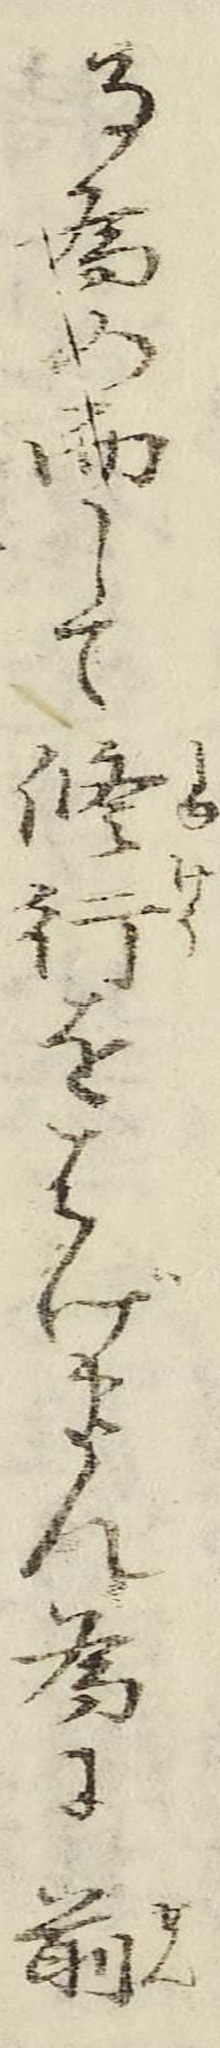る為め而して修行をはげまん為に前
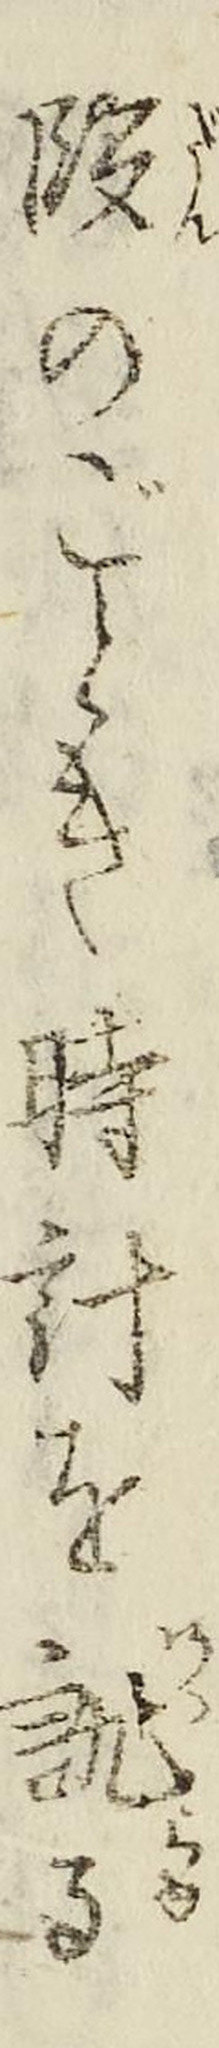段のごとき時計を誂る
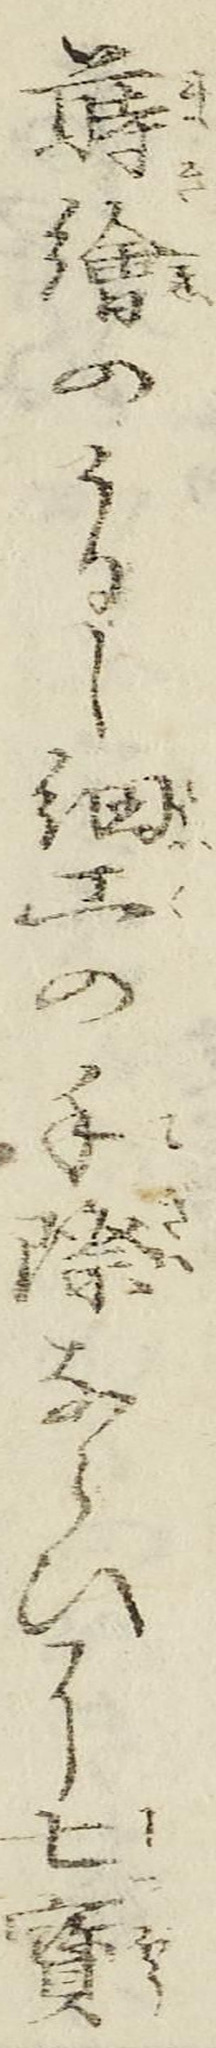蒔絵のうるし細工の手際ならひに七宝
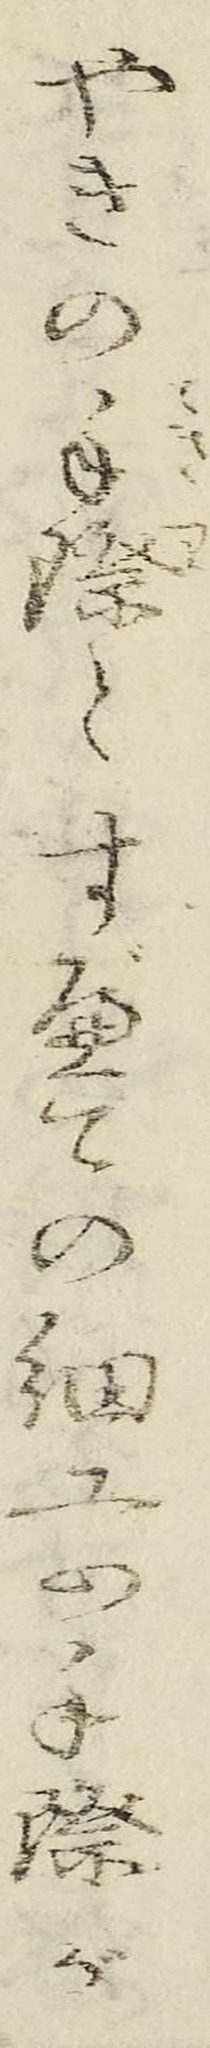やきの手際とすべての細工の手際が
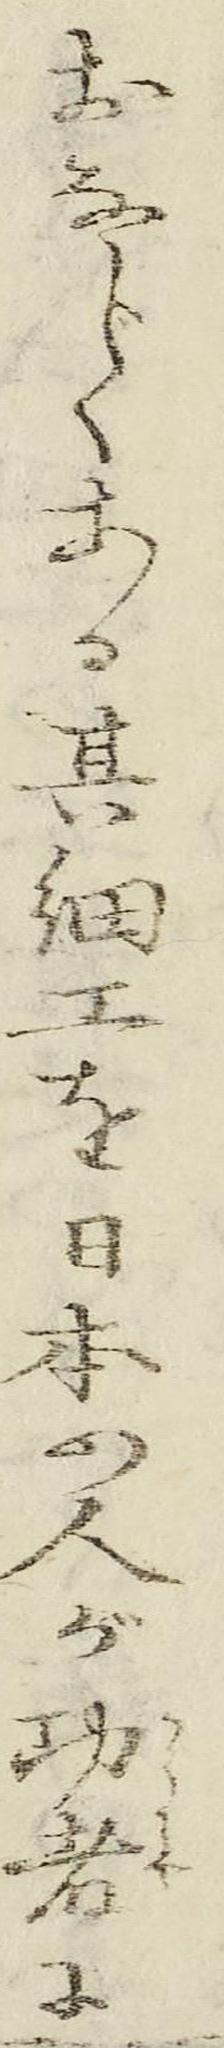おなじくある其細工を日本の人が巧者に
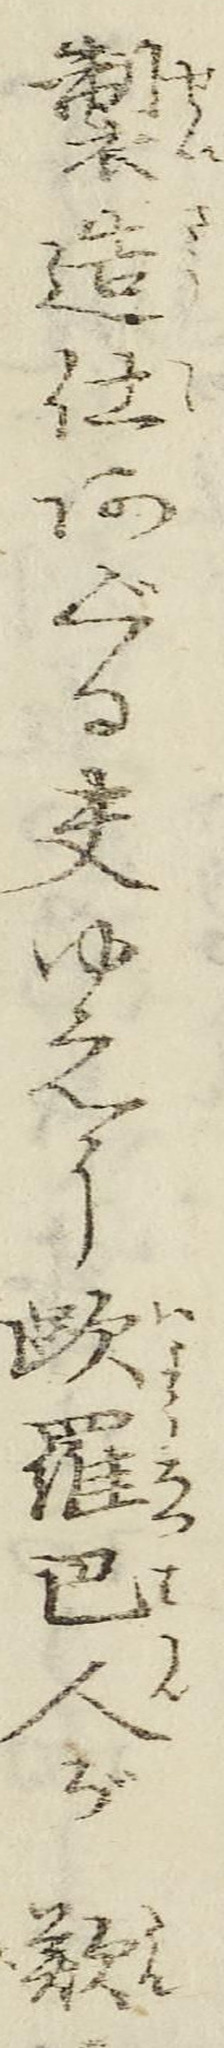製造仕あぐる夫ゆえに欧羅巴人が歎
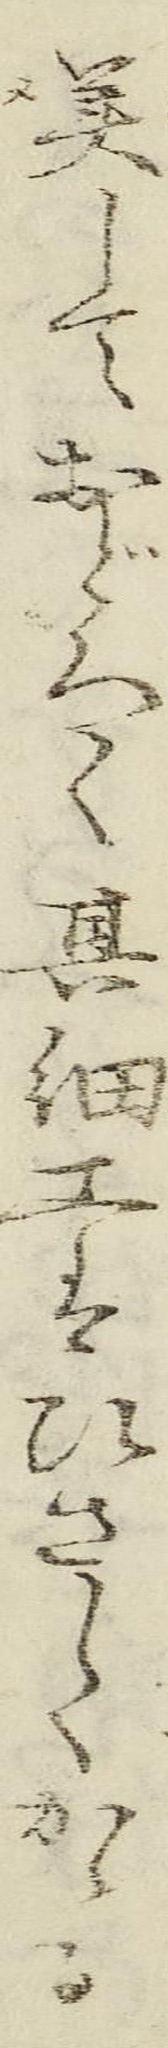美しておどろく其細工はひさしくかゝる
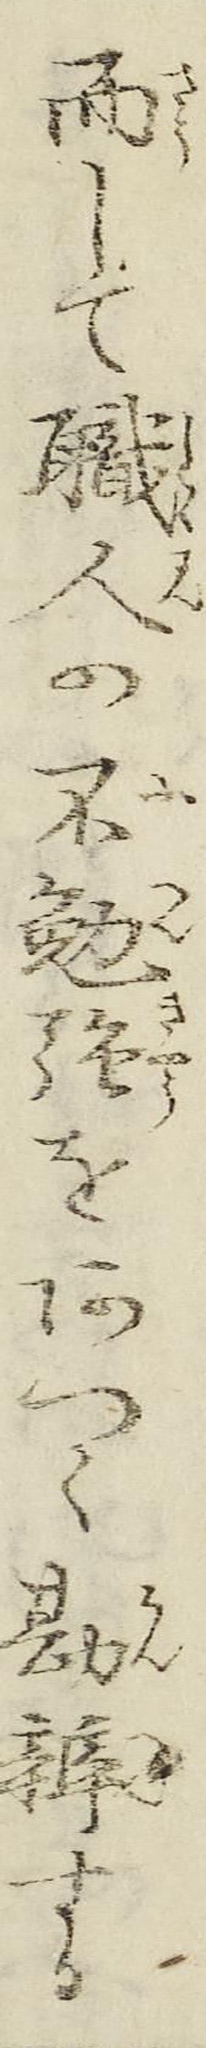而して職人の不勉強をあつく勘弁する
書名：[時計に関する冊子]
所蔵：東京大学地震研究所図書室 Earthquake Research Institute Library, The University of Tokyo, JAPAN
